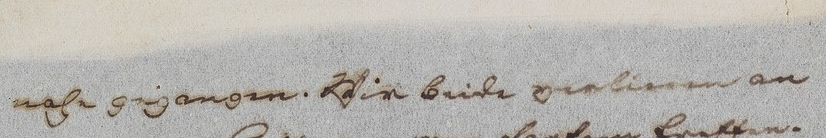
nahe gegangen. Wir beide verlieren an
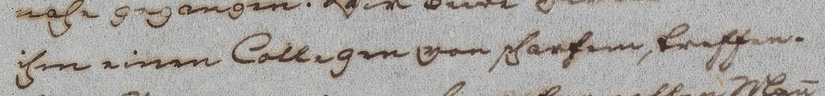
ihm einen Collegen von scharfem, treffen-
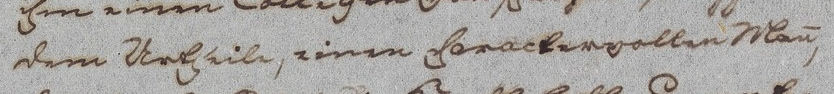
dem Urtheile, einen charactervollen Mann,
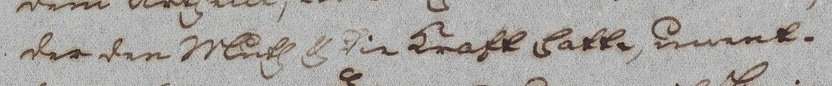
der den Muth & die Kraft hatte, unent-
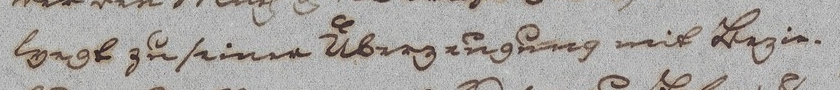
wegt zu seiner Überzeugung mit Bezie-
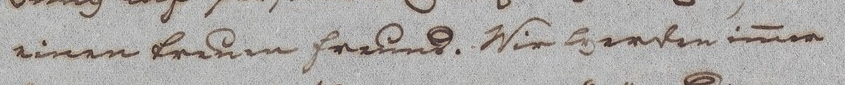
einen treuen Freund. Wir werden immer
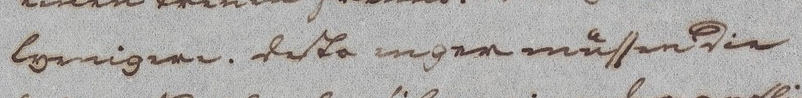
weniger. Desto enger müssen die
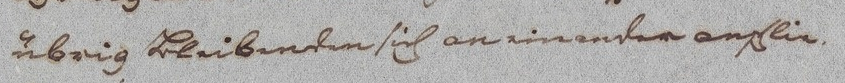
übrig Bleibenden sich an einander anschlie-
